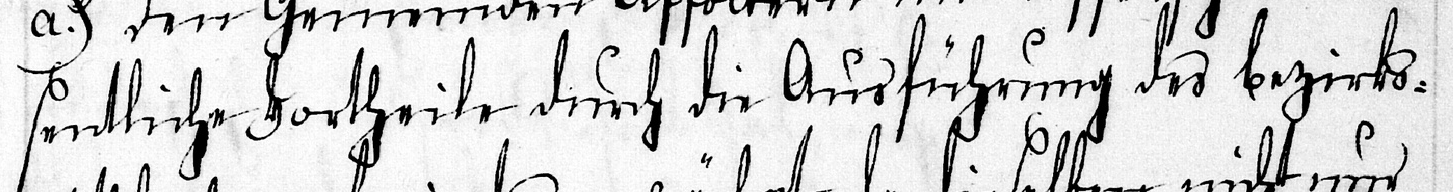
sentliche Vortheile durch die Ausführung des bezirks¬
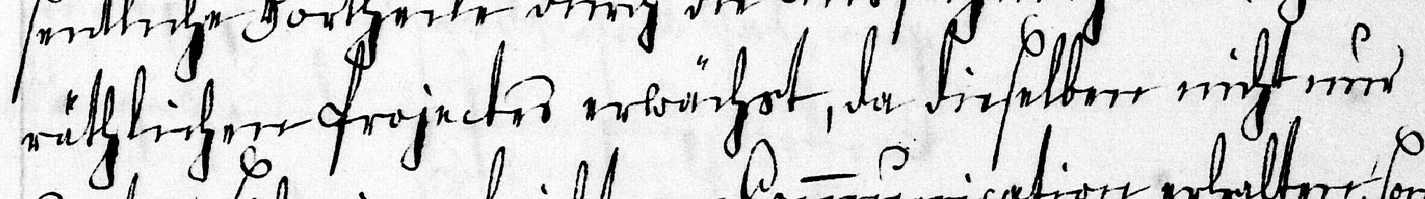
räthlichen Projectes erwächst, da dieselben nicht nur
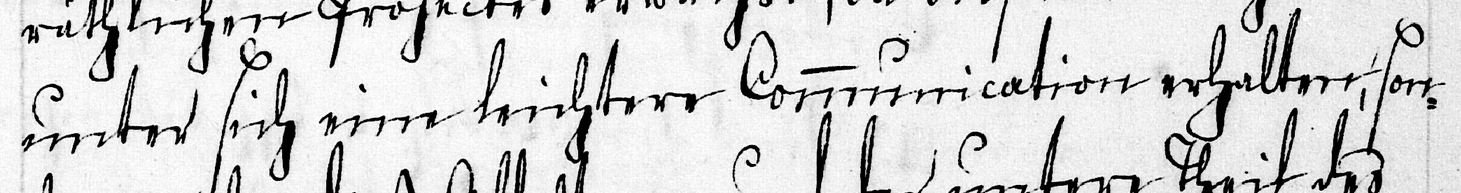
unter sich eine leichtere Communication erhalten, son¬
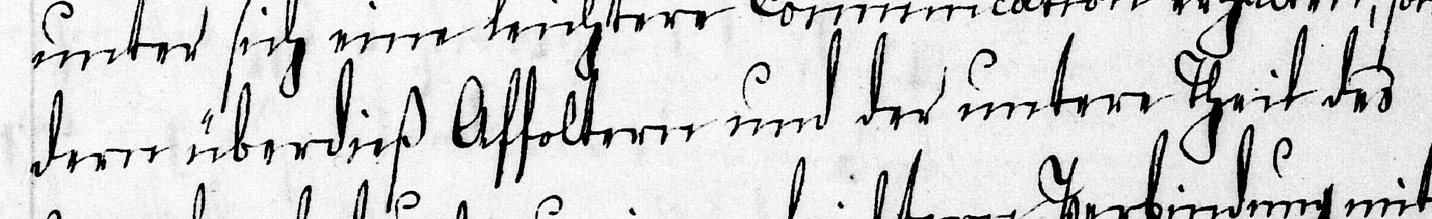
dern überdieß Affoltern und der untere Theil des
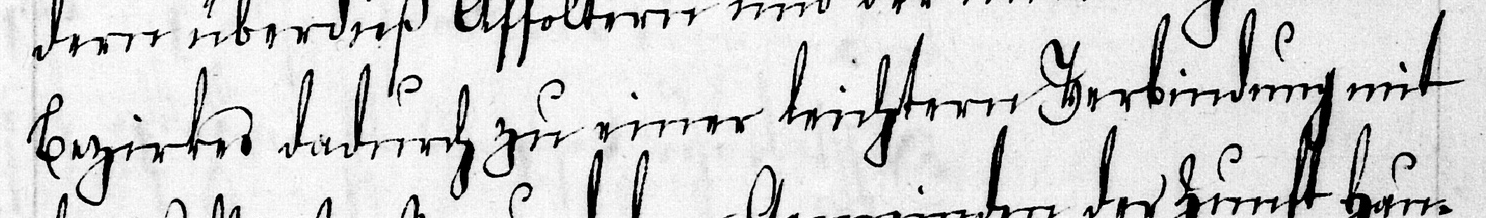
Bezirkes dadurch zu einer leichtern Verbindung mit
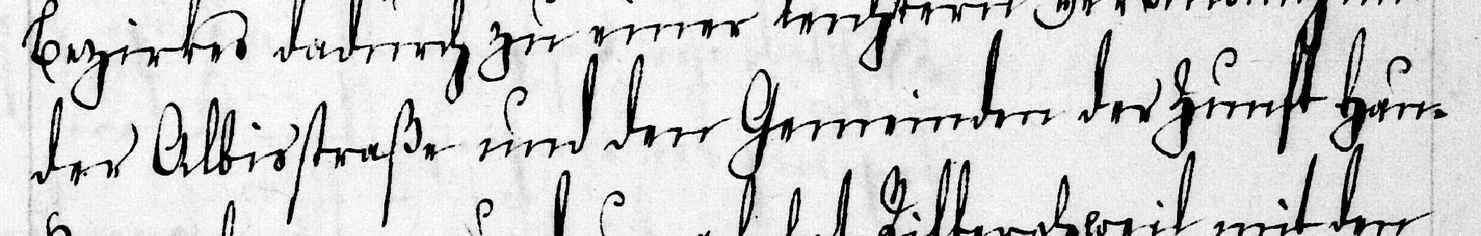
der Albisstraße und den Gemeinden der Zunft Hau¬
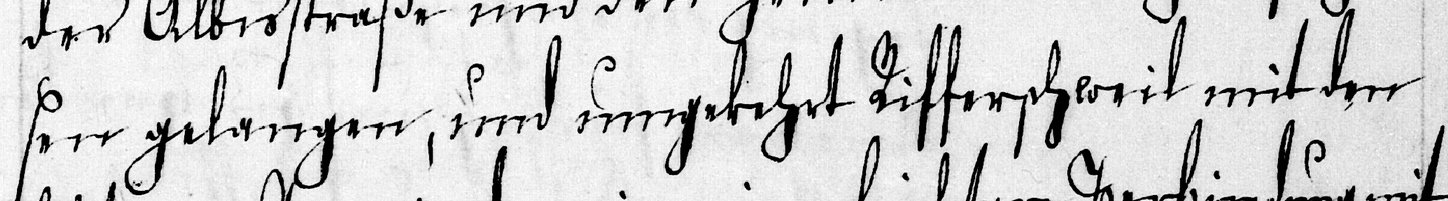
sen gelangen, und umgekehrt Rifferschweil mit den
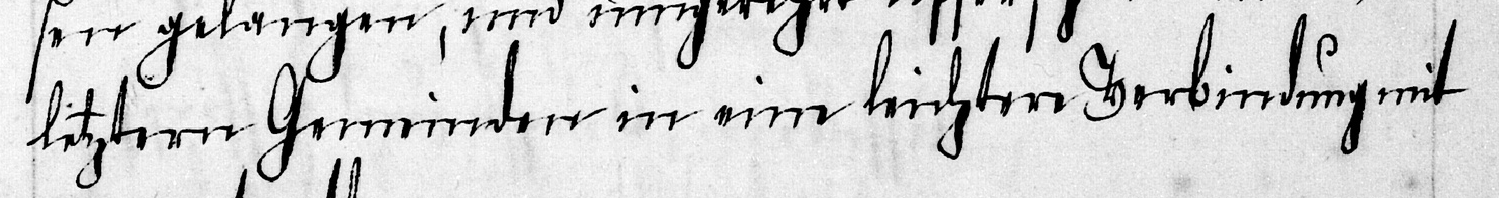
letztern Gemeinden in eine leichtere Verbindung mit
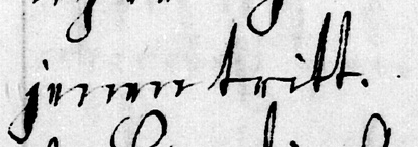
jenen tritt.
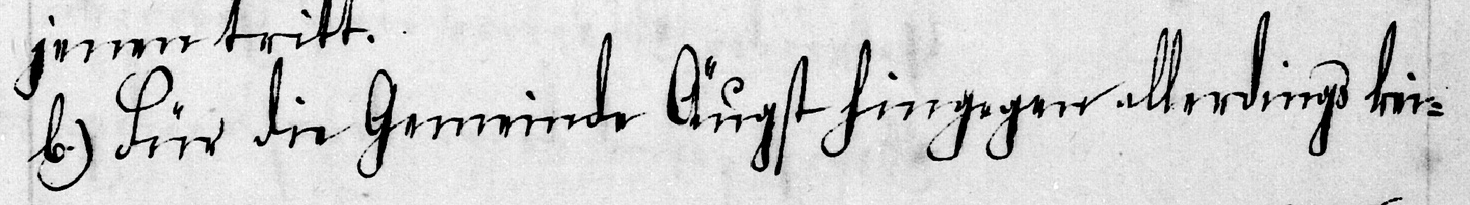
b.) Für die Gemeinde Äugst hingegen allerdings kei-
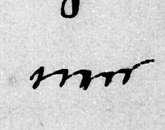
en
